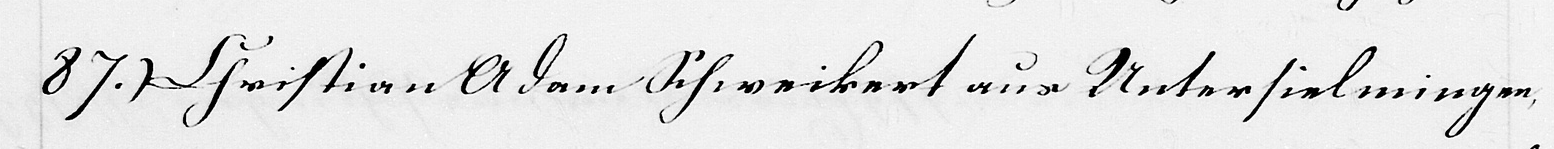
87.) Christian Adam Schweikert aus Untersielmingen,
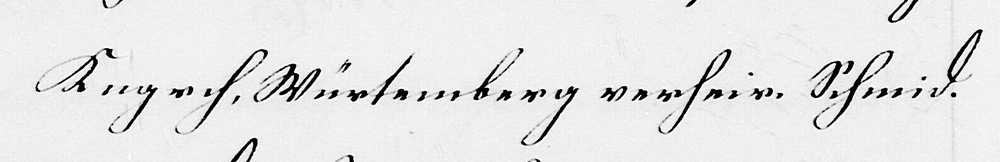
Kngrch. Würtemberg verheir. Schmid.
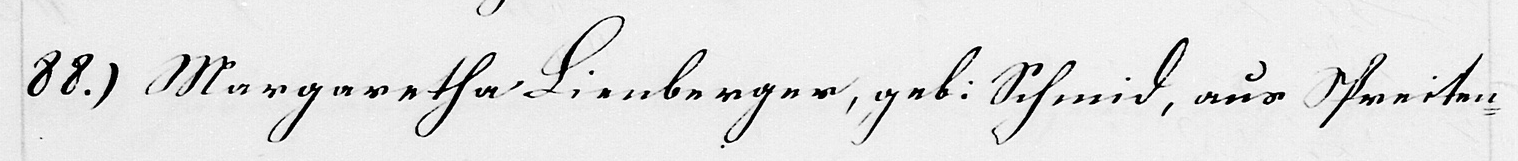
88.) Margaretha Lienberger, geb: Schmid, aus Spreiten¬
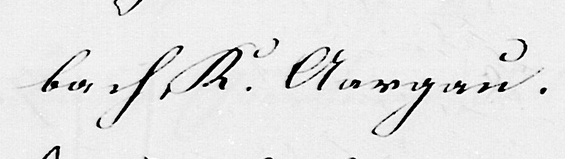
bach, K. Aargau.
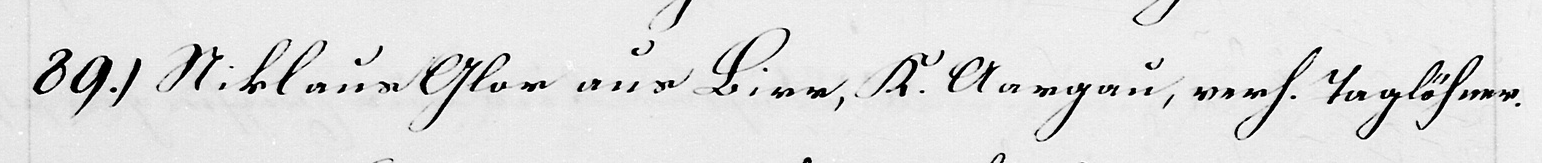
89.) Niklaus Glor aus Birr, K. Aargau, verh. Taglöhner.
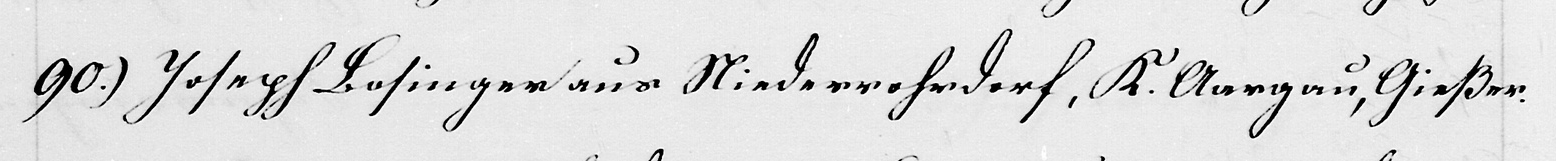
90.) Joseph Bosinger aus Niederrohrdorf, K. Aargau, Gießer.
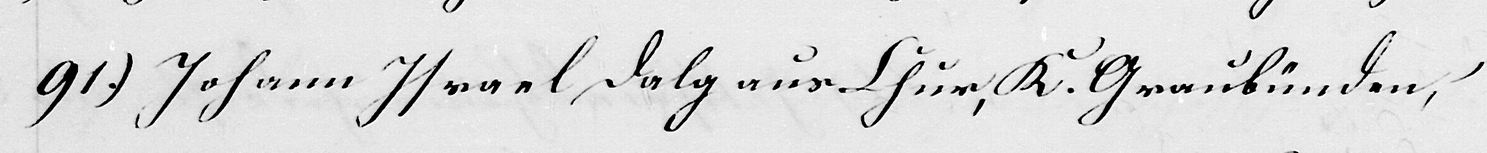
91.) Johann Israel Dalg aus Chur, K. Graubünden,
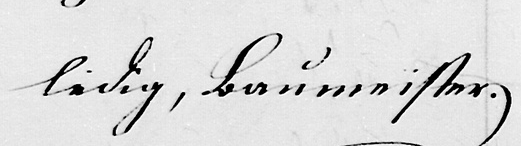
ledig, Baumeister.
